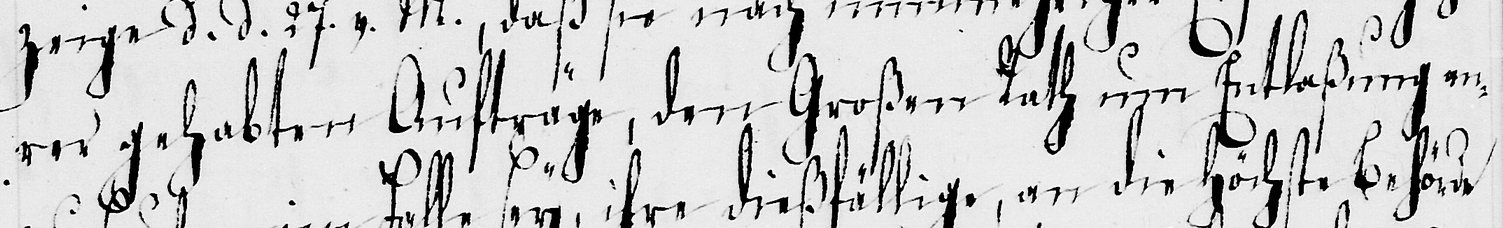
rer gehabten Aufträge, den Großen Rath um Entlaßung an¬
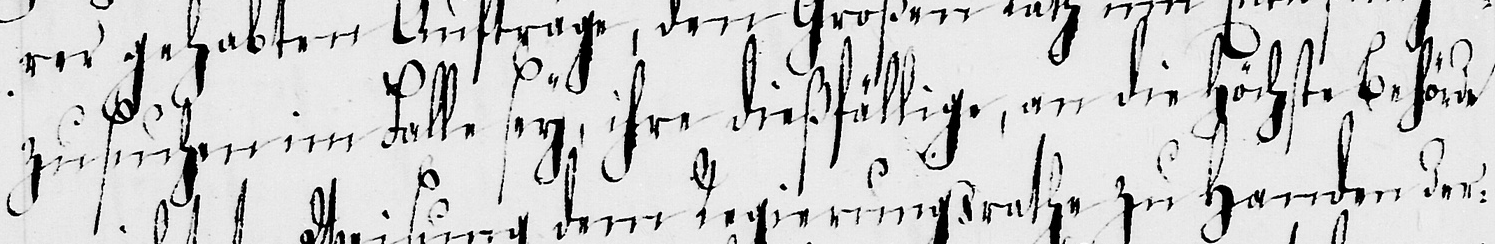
zusuchen im Falle sey, ihre dießfällige, an die Höchste Behör¬
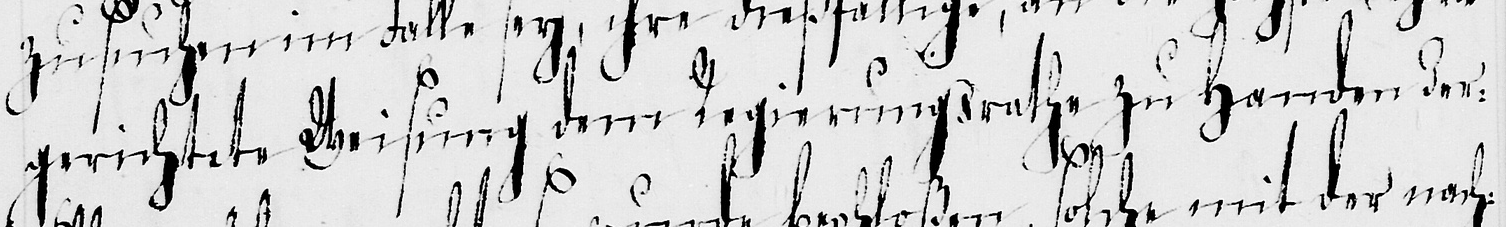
gerichtete Weisung dem Regierungsrathe zu Handen der¬
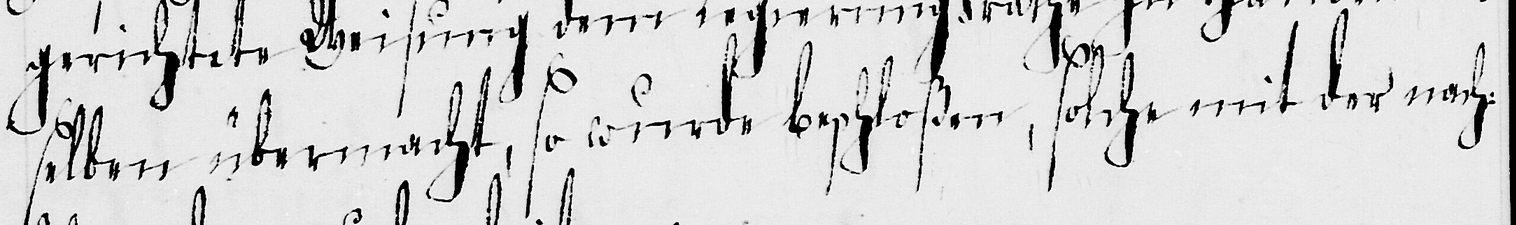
selben übermacht, so wurde beschloßen, solche mit der nach¬
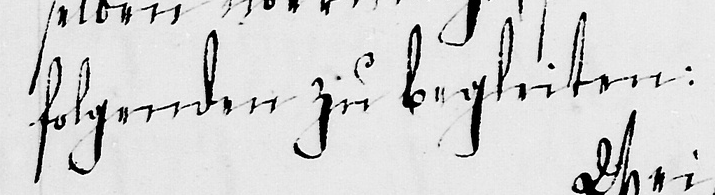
folgenden zu begleiten:
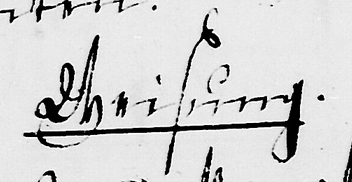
Weisung.
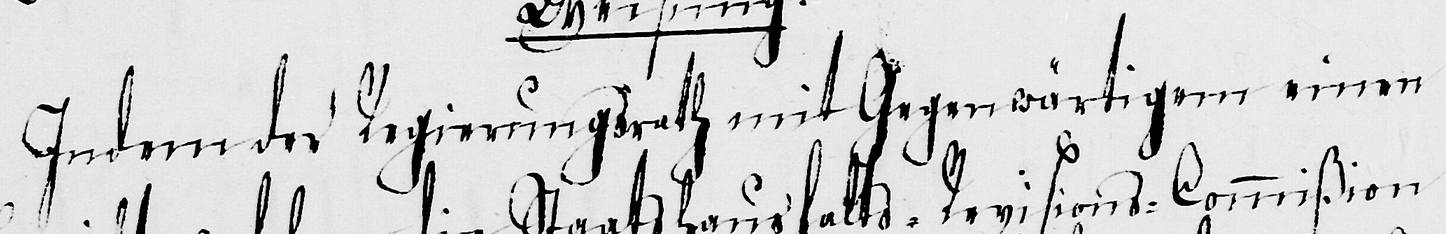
Indem der Regierungsrath mit Gegenwärtigem einen
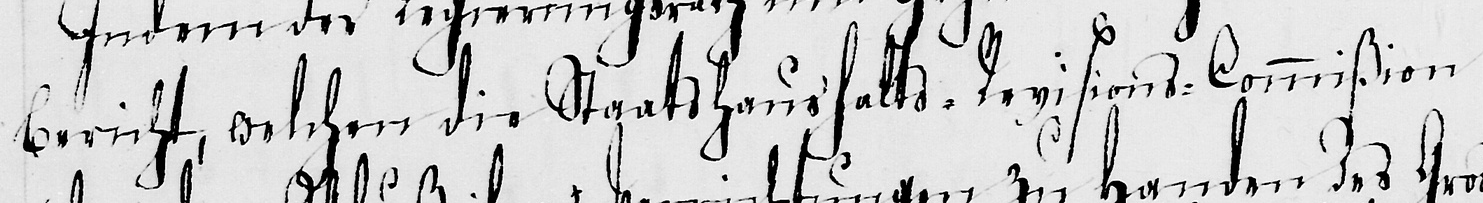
Bericht, welchen die Staatshaushalts-Revisions-Commißion
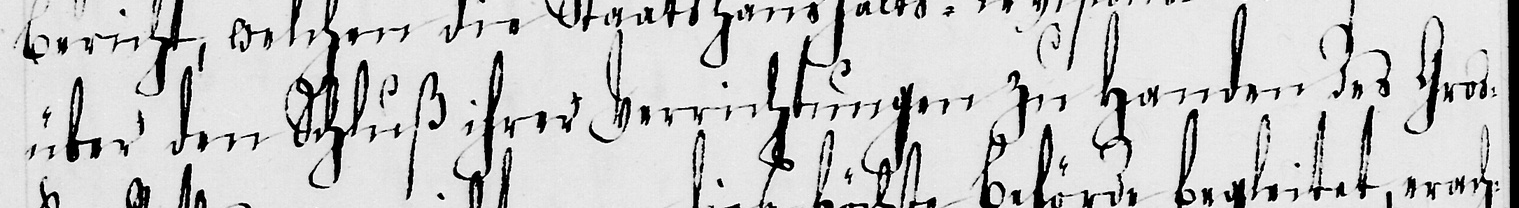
über den Schluß ihrer Verrichtungen zu Handen des Gro¬
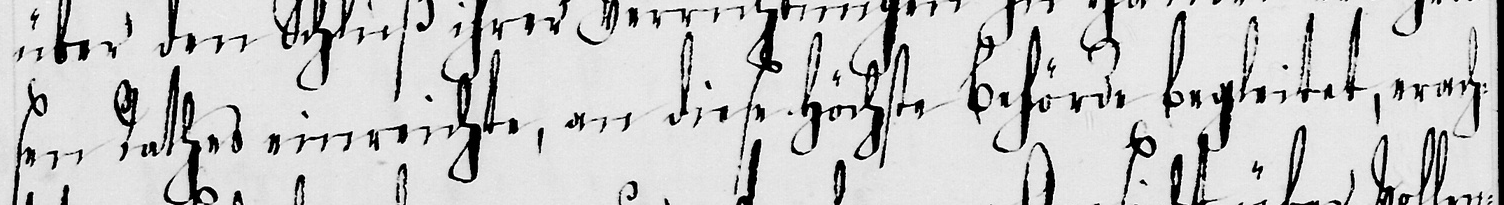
ßen Rathes einreichte, an diese Höchste Behörde begleitet, era¬
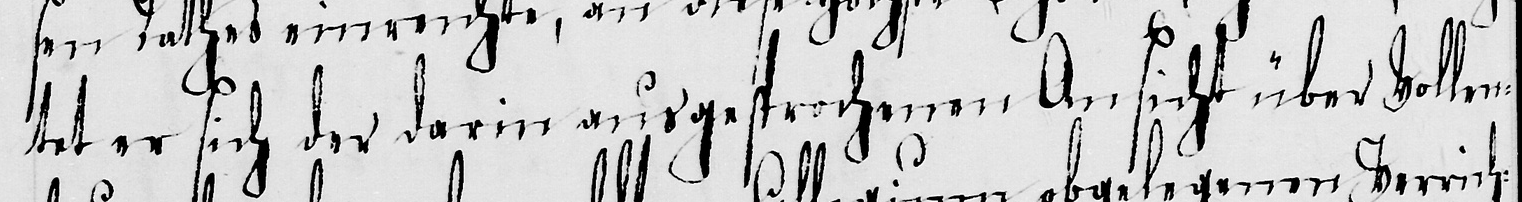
tet er sich der darin ausgesprochenen Ansicht über Volle¬
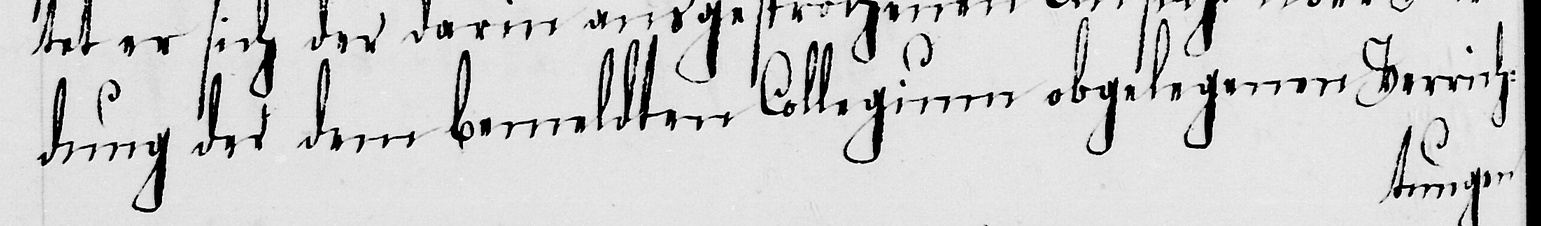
ndung der dem bemeldten Collegium obgelegenen Verri¬
